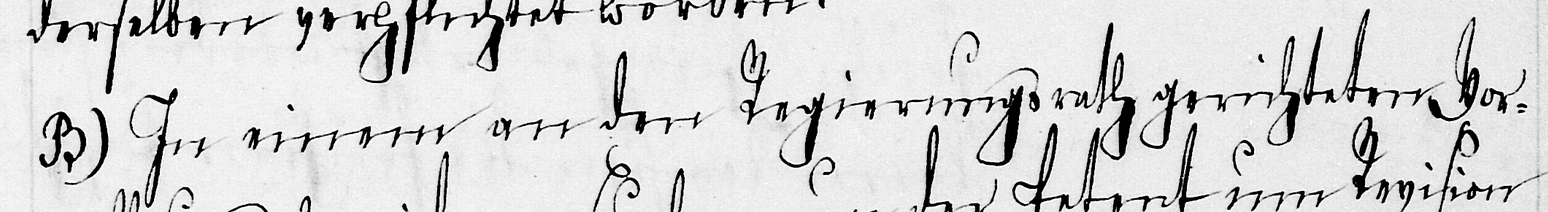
B.) In einem an den Regierungsrath gerichteten Vor¬
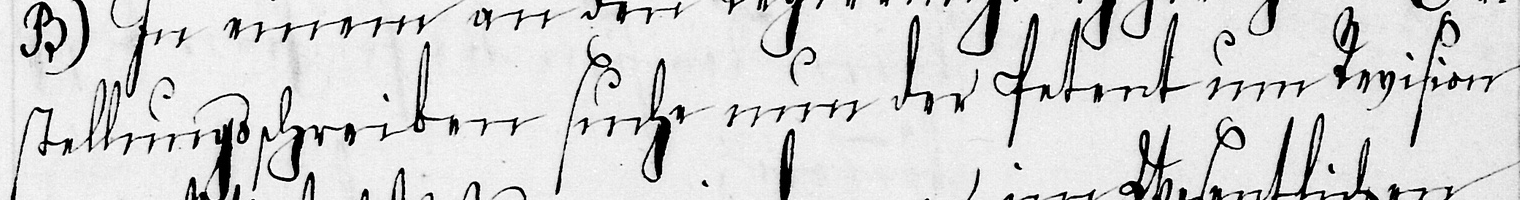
stellungsschreiben suche nun der Petent um Revision
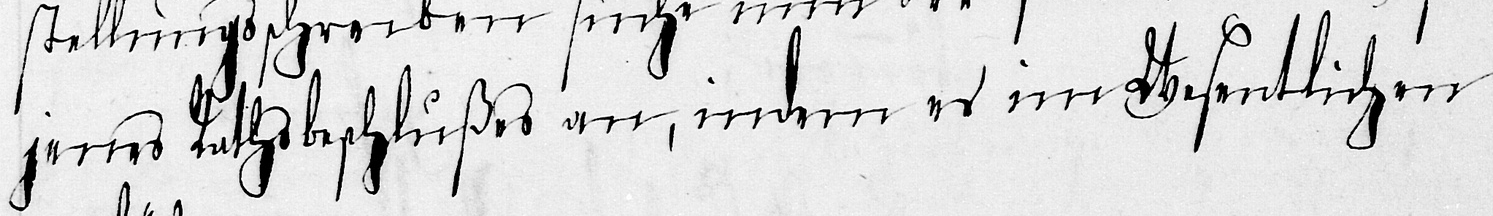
jenes Rathsbeschlußes an, indem er im Wesentlichen
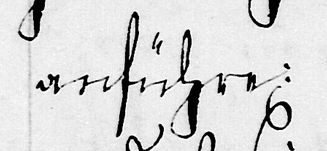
anführe:
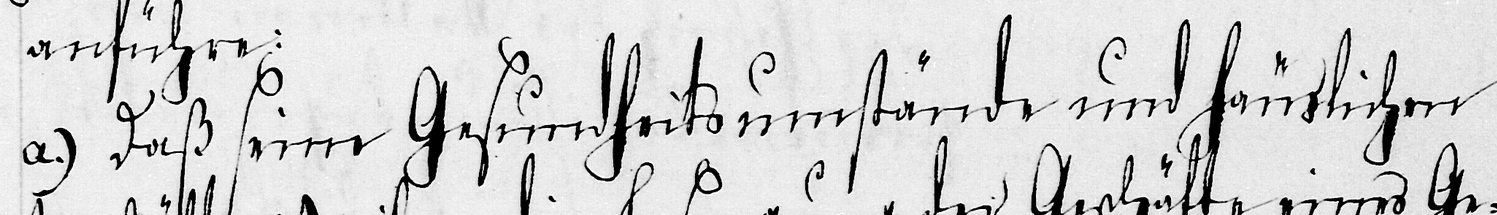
a.) Daß seine Gesundheitsumstände und häuslichen
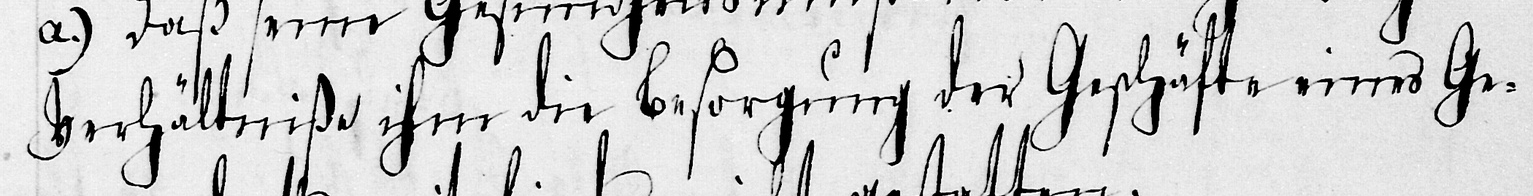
Verhältniße ihm die Besorgung der Geschäfte eines Ge¬
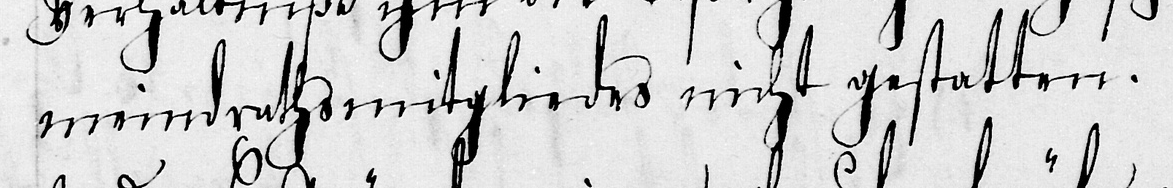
meindrathsmitgliedes nicht gestatten.
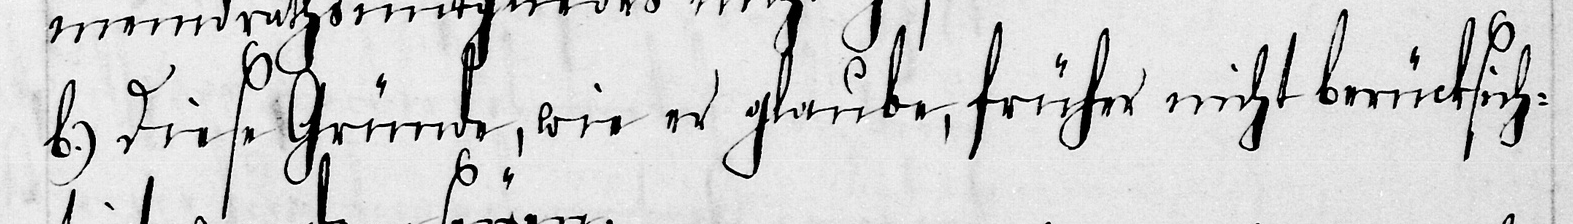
b.) Diese Gründe, wie er glaube, früher nicht berücksich¬
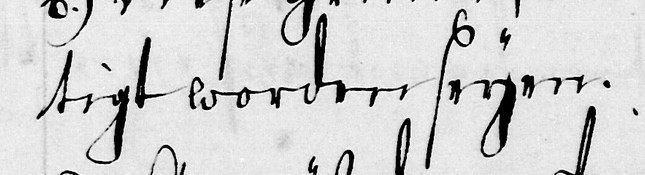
tigt worden seyen.
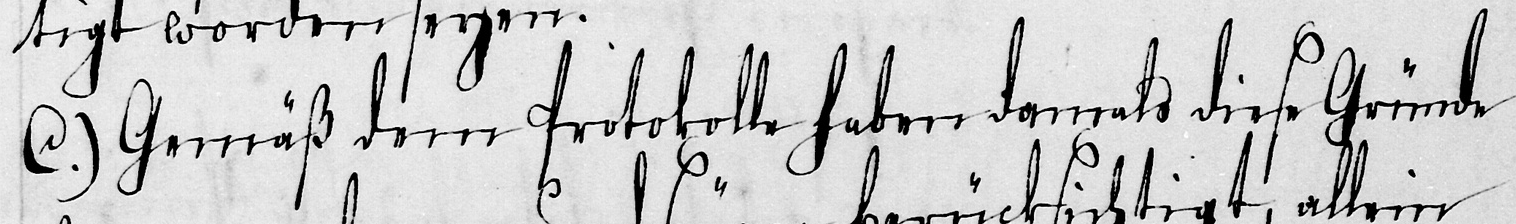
C.) Gemäß dem Protokolle haben damals diese Gründe
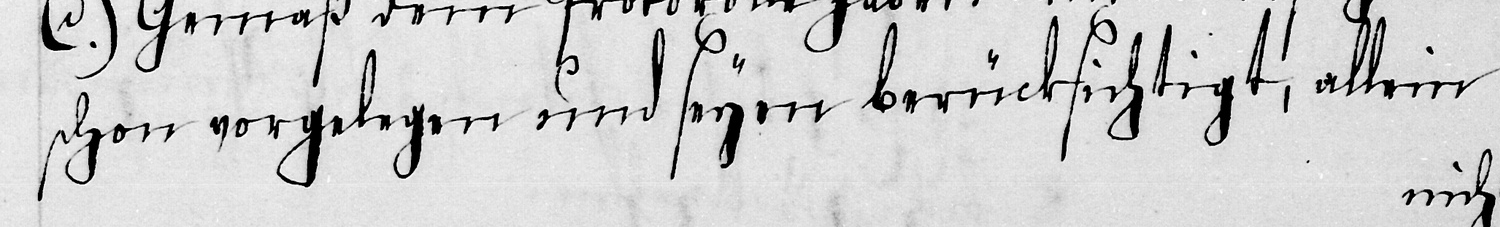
schon vorgelegen und seyen berücksichtigt, allein
